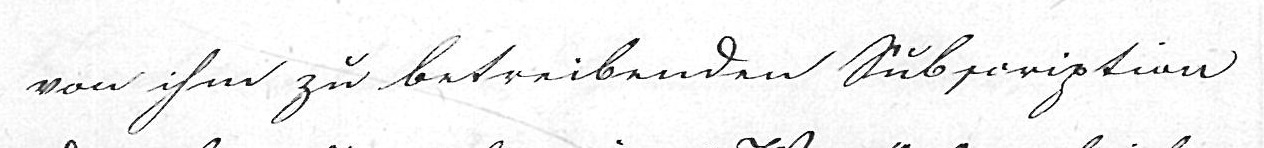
von ihn zu betreibenden Subscription
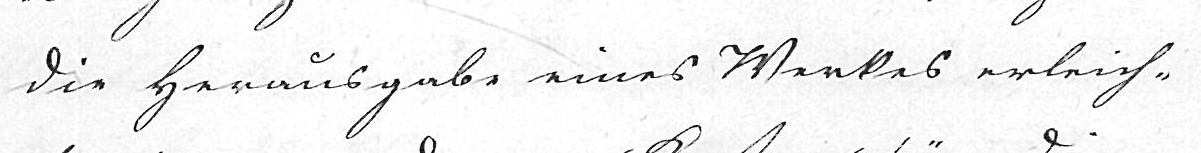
die Herausgabe eines Werkes erleich-
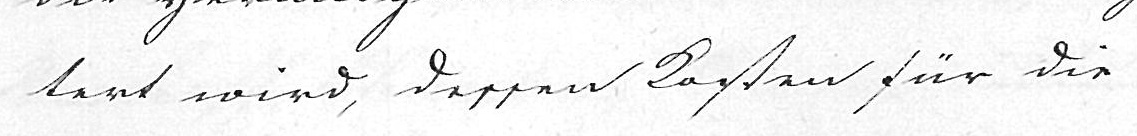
tert wird, dessen Kosten für die
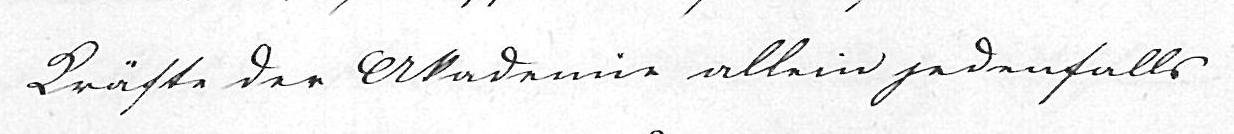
Kräfte der Akademie allein jedenfalls
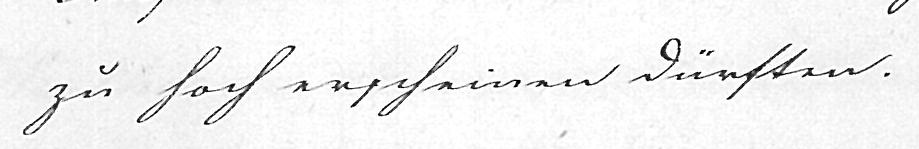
zu hoch erscheinen dürften.
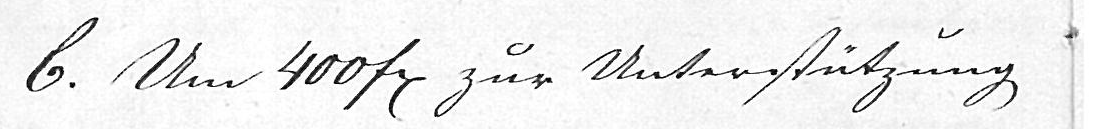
b. Um 400 fr zur Unterstützung
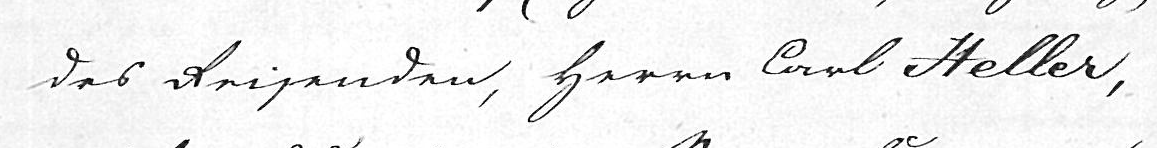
des Reisenden, Herrn Carl Heller,
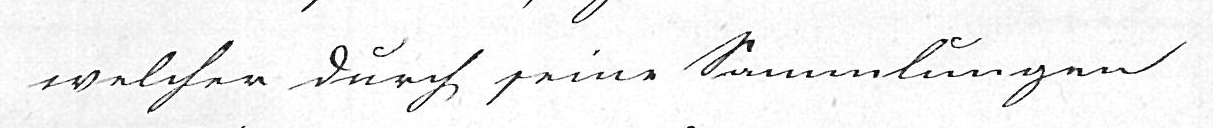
welcher durch seine Sammlungen
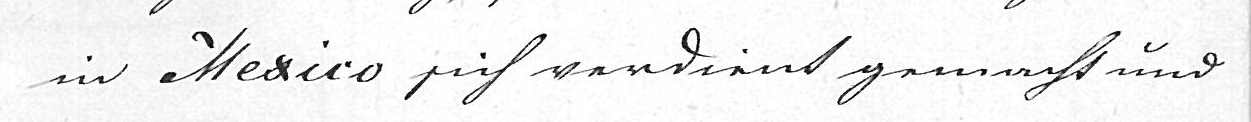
in Mexico sich verdient gemacht und
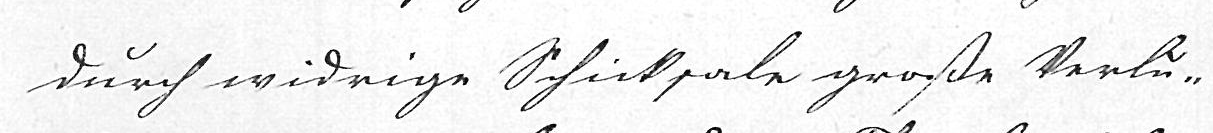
durch widrige Schicksale große Verlu-
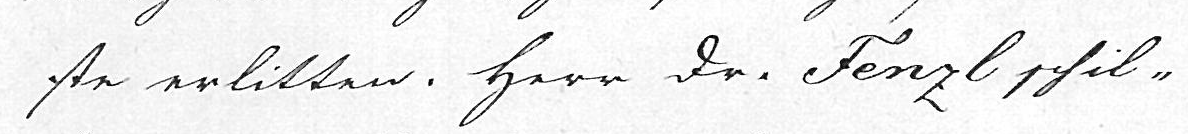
ste erlilten. Herr Dr. Fenzl schil-
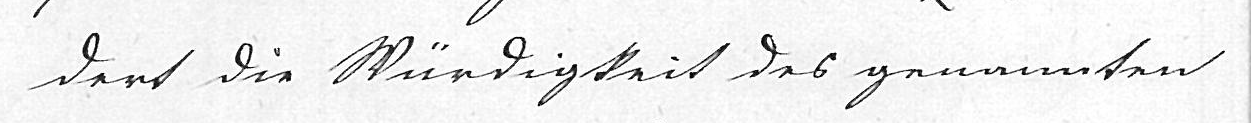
dert die Würdigkeit des genannten
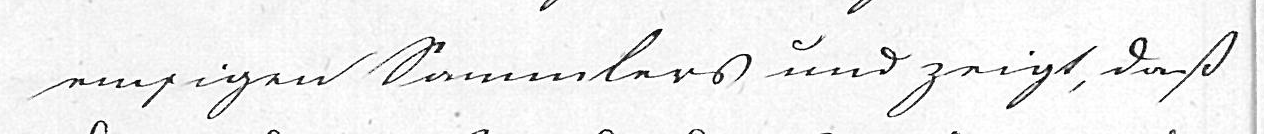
emsigen Sammlers und zeigt, daß
